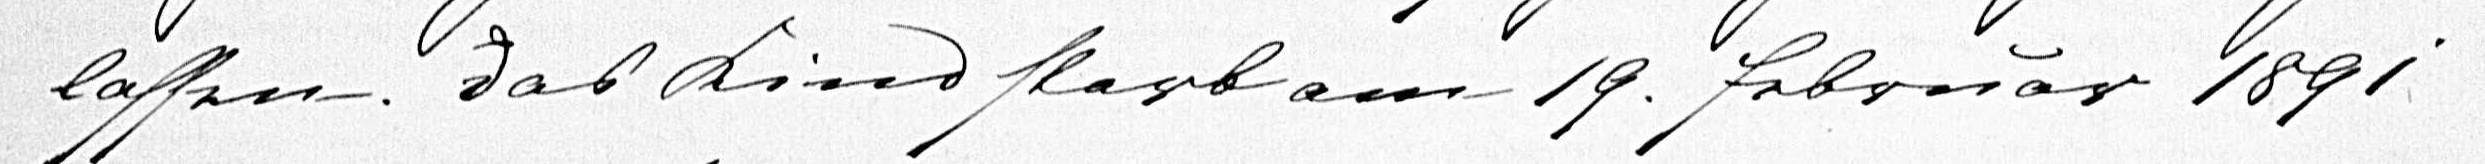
lassen. Das Kind starb am 19. Februar 1891
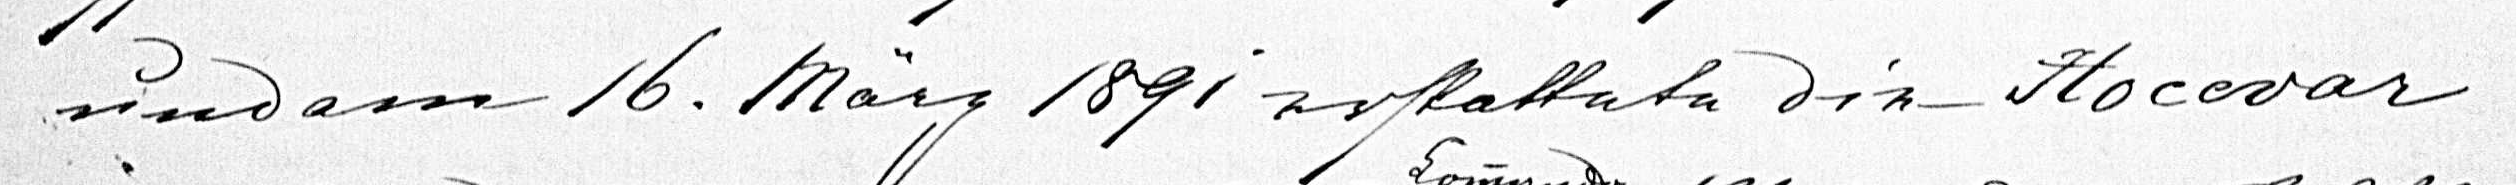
und am 16. März 1891 erstattete die Hocevar
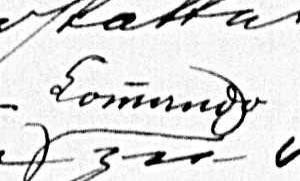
Commando
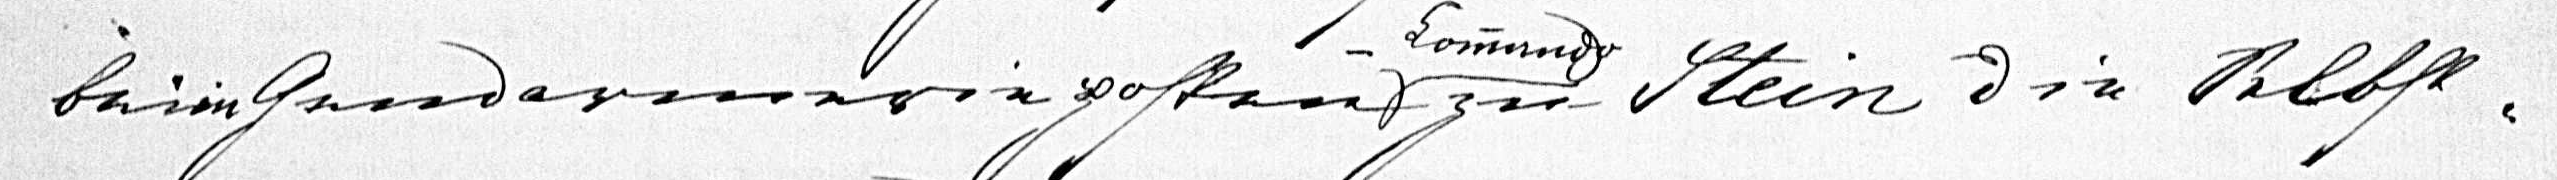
beim Gendarmerieposten- zu Stein die Selbst¬
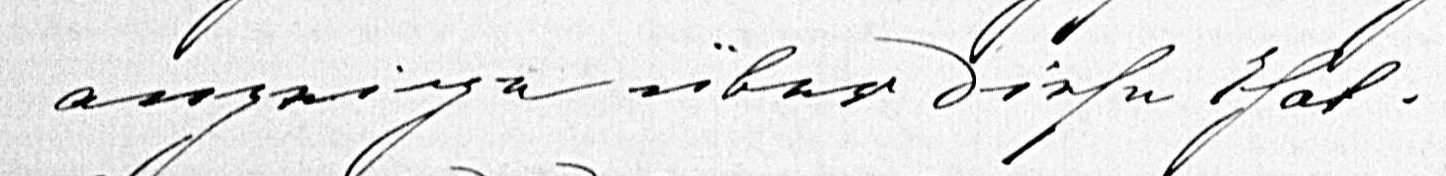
anzeige über diese That.
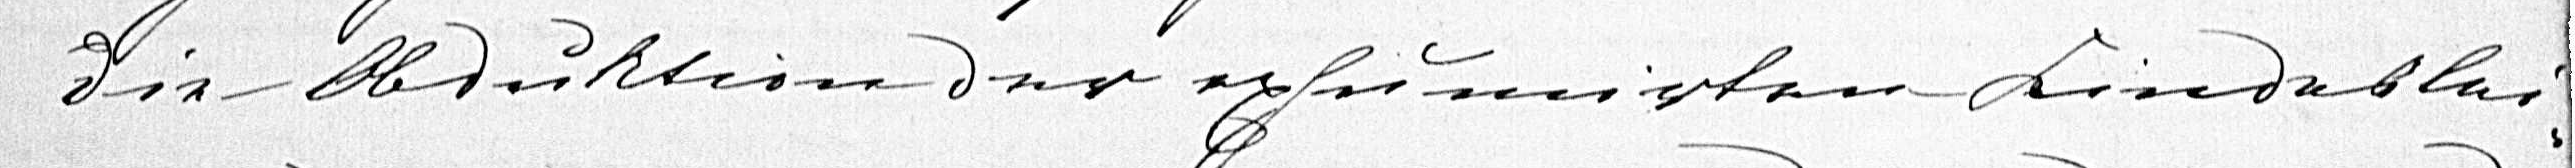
Die – Obduktion der exhumirten Kindeslei¬
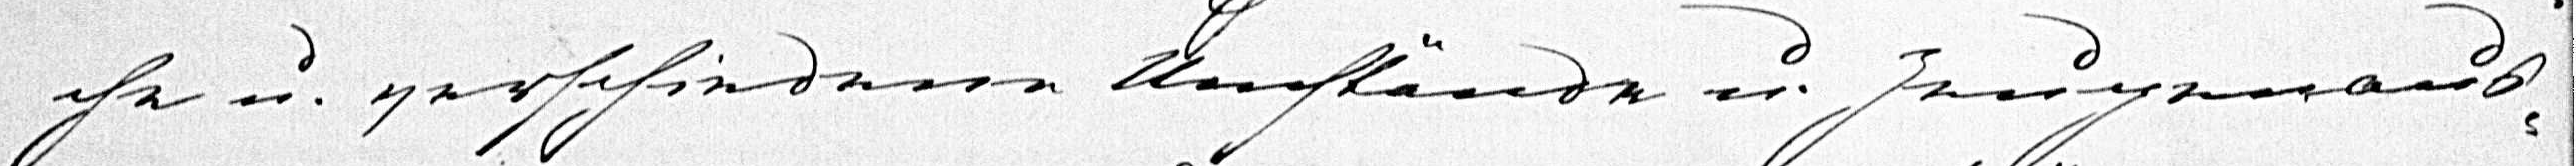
che u. verschiedene Umstände u. Zeugenaus¬
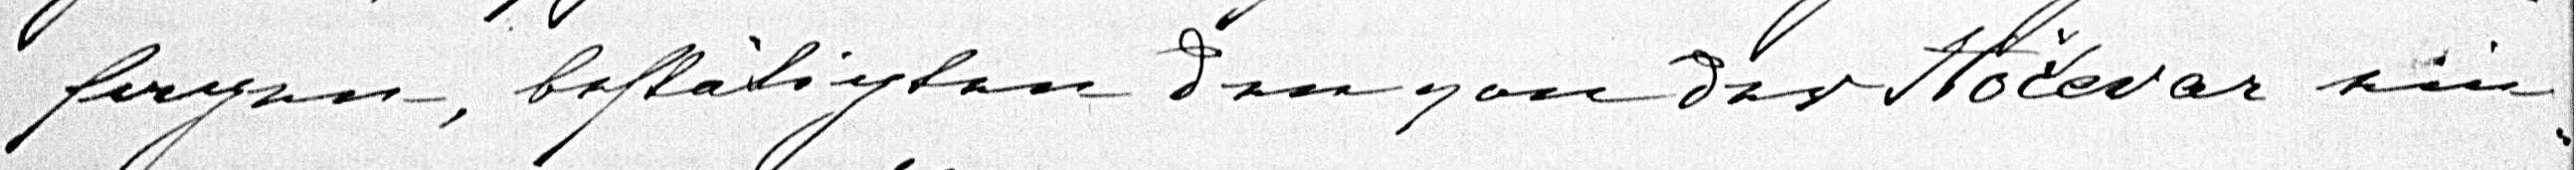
sagen, bestätigten den von der Hočevar ein¬
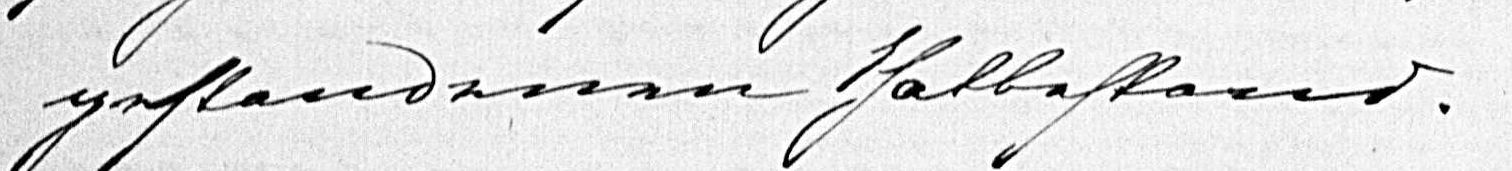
gestandenen Thatbestand.
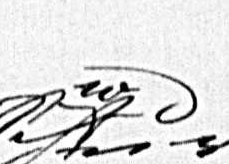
w
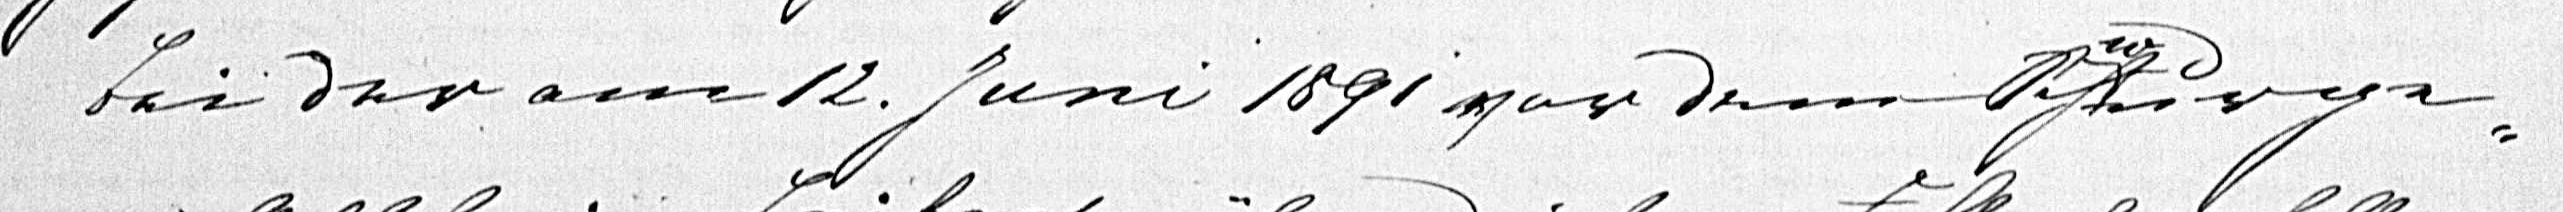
Bei der am 12. Juni 1891 vor dem Schurge¬
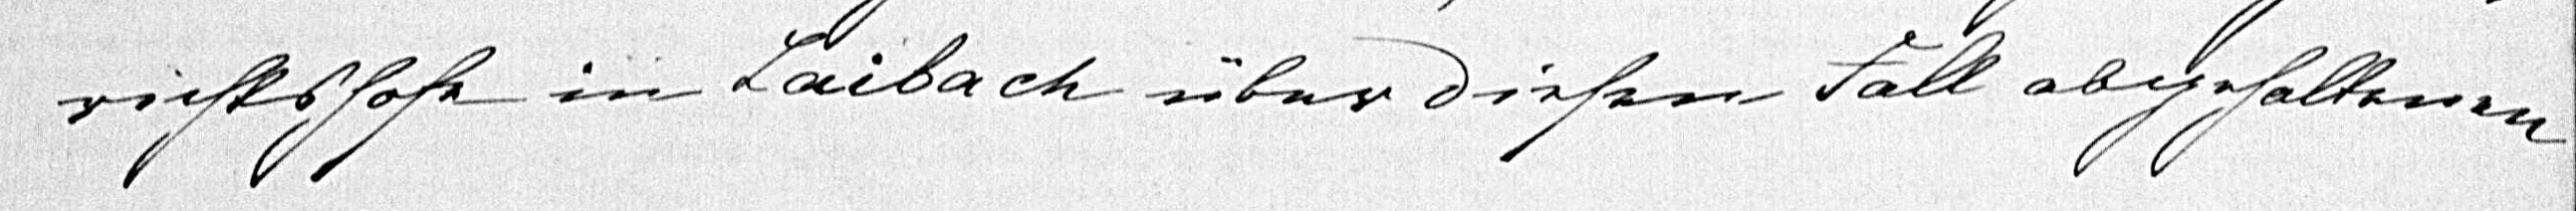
richtshofe in Laibach über diesen Fall abgehaltenen
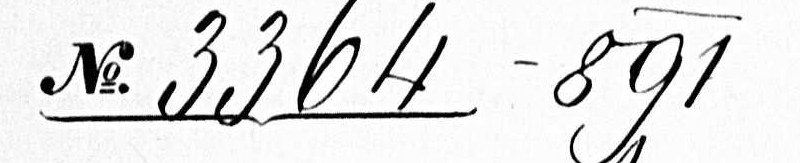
No. 3364 - 1891
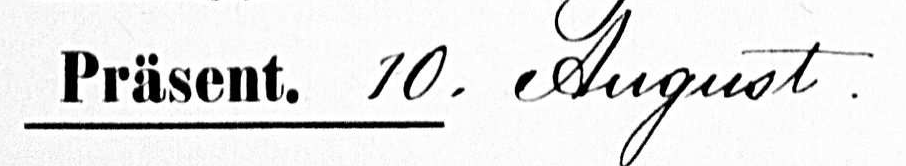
Präsent. 10. August
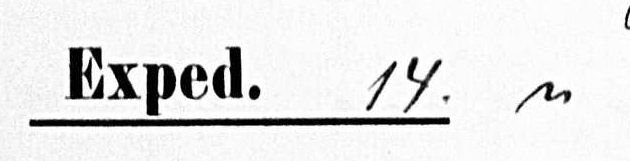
Exped. 14. „
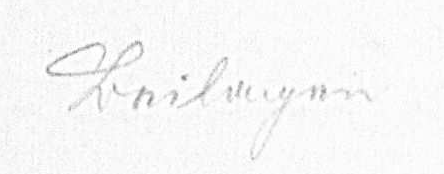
Beilagen
